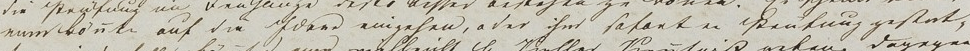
man könnte auf die Ideen eingehen, oder ihm sofort e. Prüfung gestat-
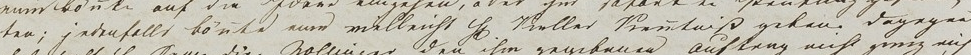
ten; jedenfalls könnte man vielleicht Herrn Keller Kenntniß geben. Dagegen
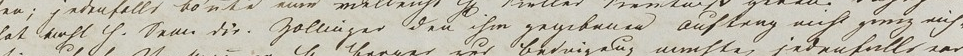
hat wohl H. Sem.Dir. Zollinger den ihm gegebenen Auftrag nicht ganz rich-
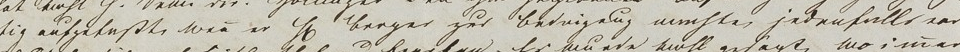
tig aufgefaßt, wenn er Herrn Berger zur Bedingung machte, jedenfalls vor
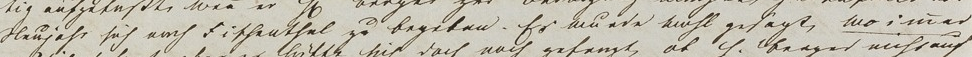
Neujahr sich nach Fischenthal zu begeben. Es wurde wohl gesagt, wo immer
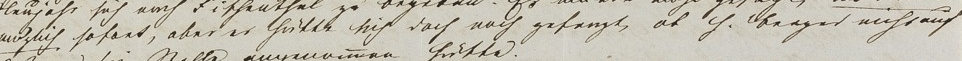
möglich sofort, aber es hätte sich doch noch gefragt, ob H. Berger nicht auf
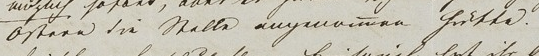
Ostern die Stelle angenommen hätte.
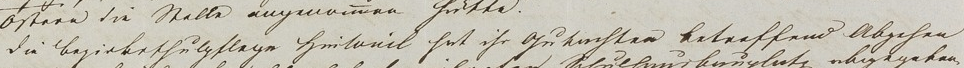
Die Bezirksschulpflege Hinweil hat ihr Gutachten betreffend Abgehen
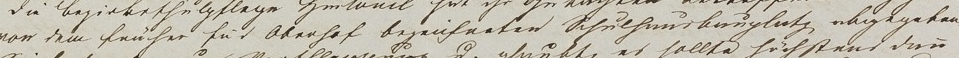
von dem früher für Oberhof bezeichneten Schulhausbauplatz abgegeben.
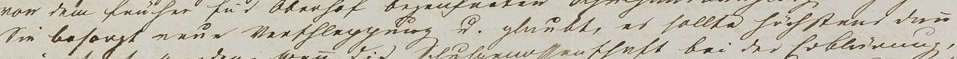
Sie besorgt neue Verschleppung u. glaubt, es sollte höchstens dann
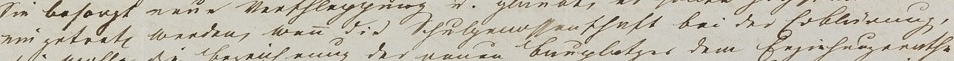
eingetreten werden, wenn die Schulgenossenschaft bei der Erklärung,
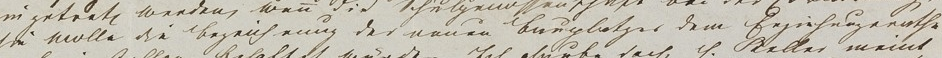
sie wolle die Bezeichnung des neuen Bauplatzes dem Erziehungsrathe
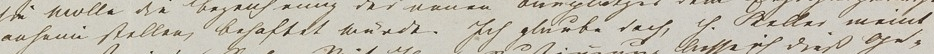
anheim stellen, behaftet würde. Ich glaube doch, H. Keller meint
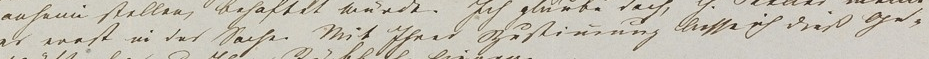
es ernst in der Sache. Mit Ihrer Zustimmung lasse ich dieß Ge-
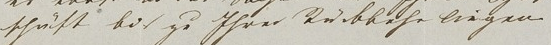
schäft bis zu Ihrer Rückkehr liegen.
